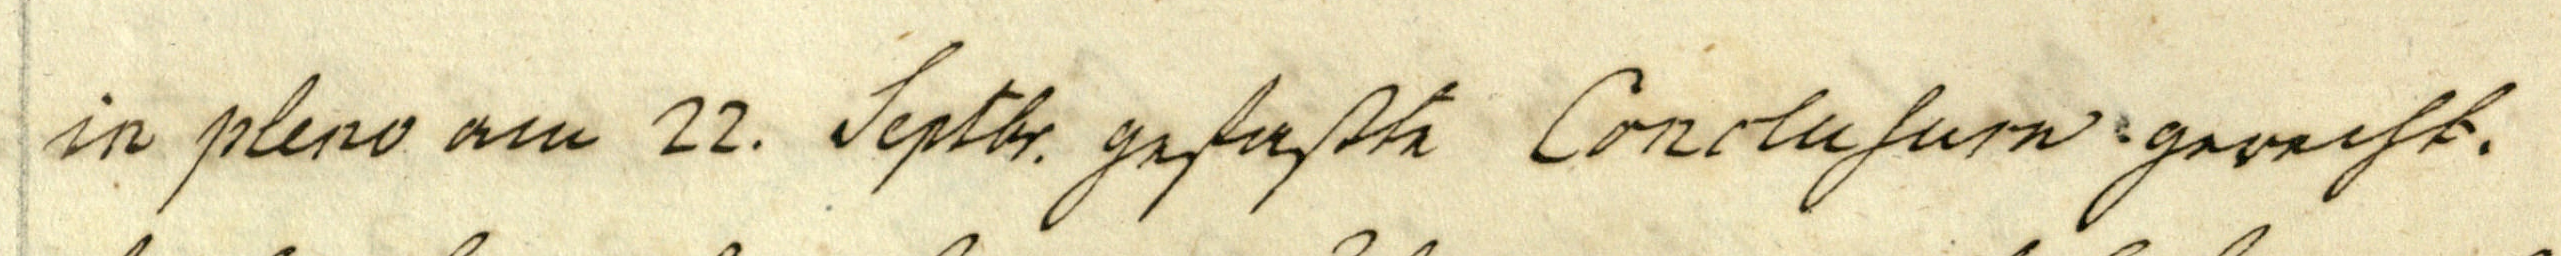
in pleno am 22. Septbr. gefaßte Conclusum gerecht¬
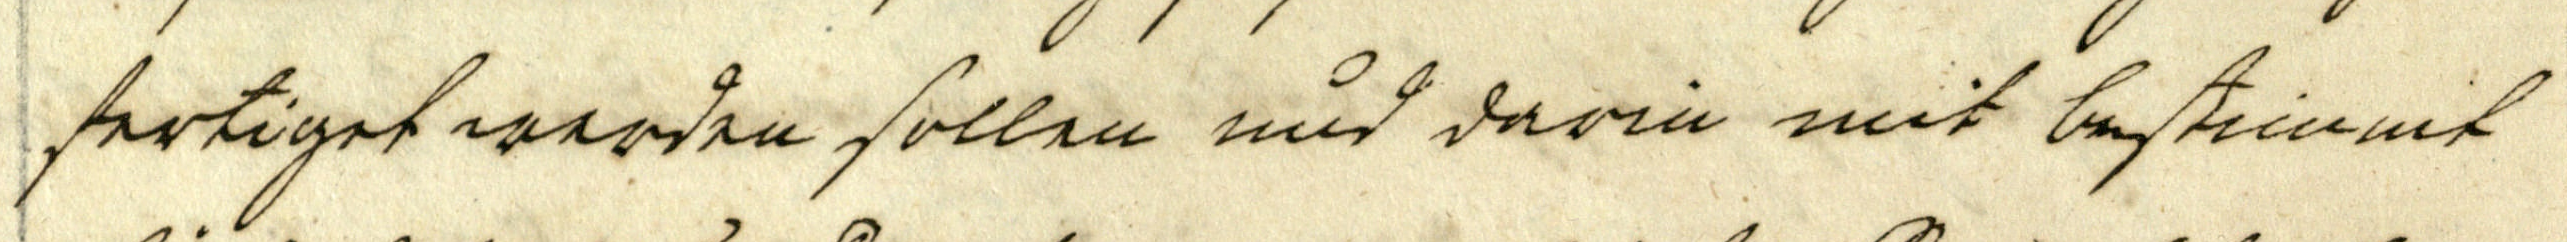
fertiget werden sollen und darin mit bestimmt
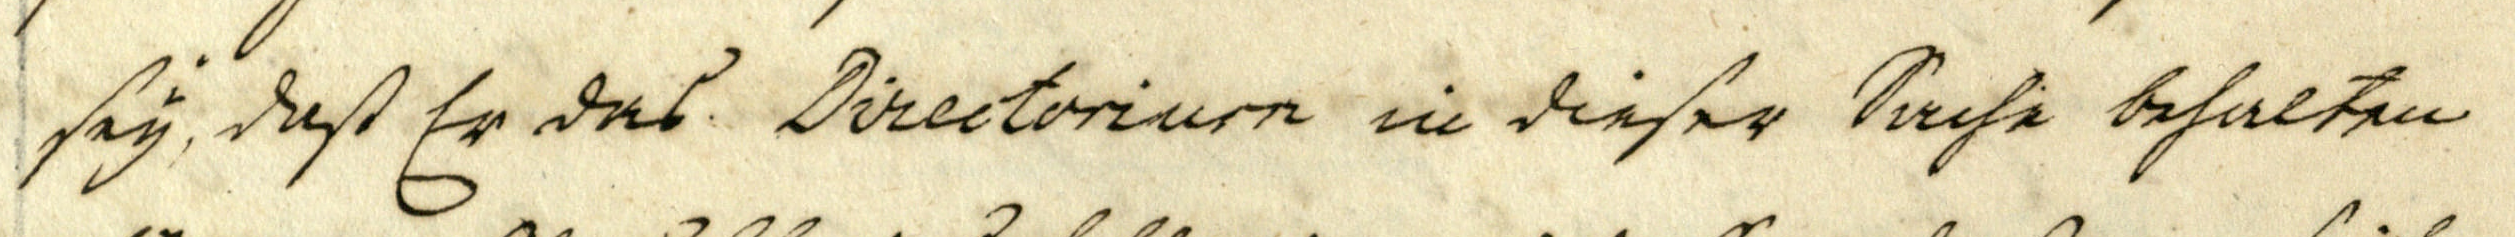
seÿ, daß Er das Directorium in dieser Sache behalten
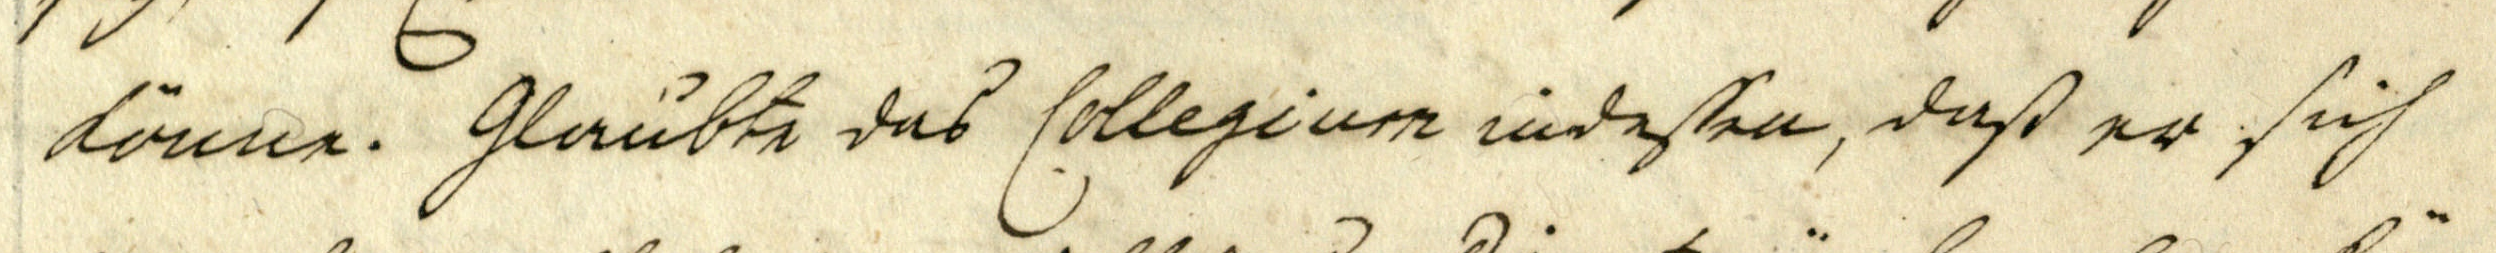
könne. Glaubte das Collegium indessen, daß er sich
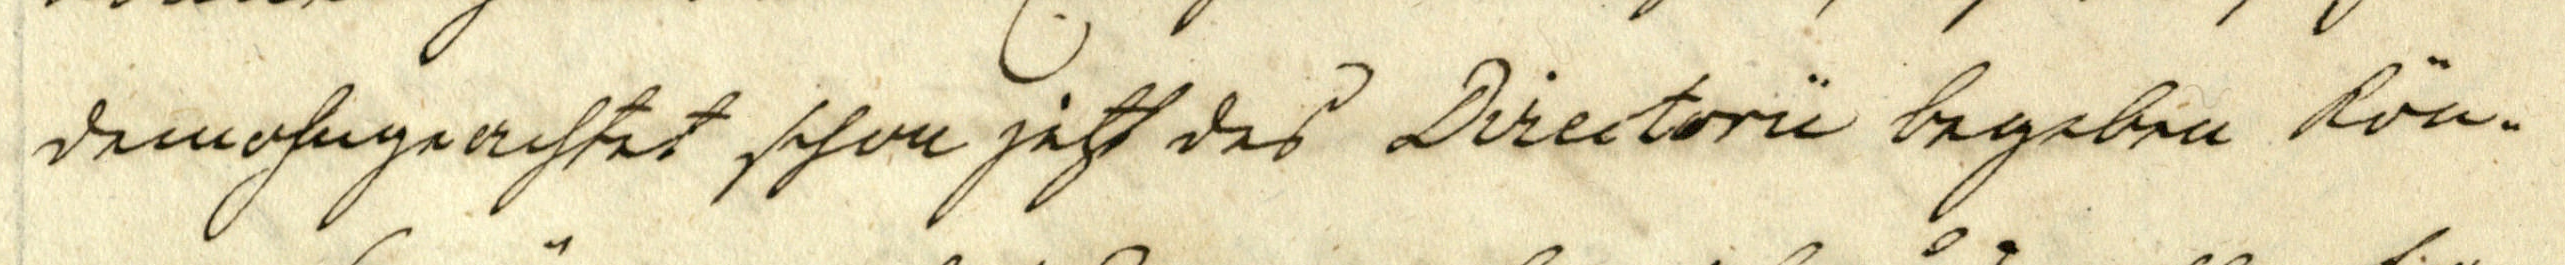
demohngeachtet schon jetzt des Directorii begeben kön¬
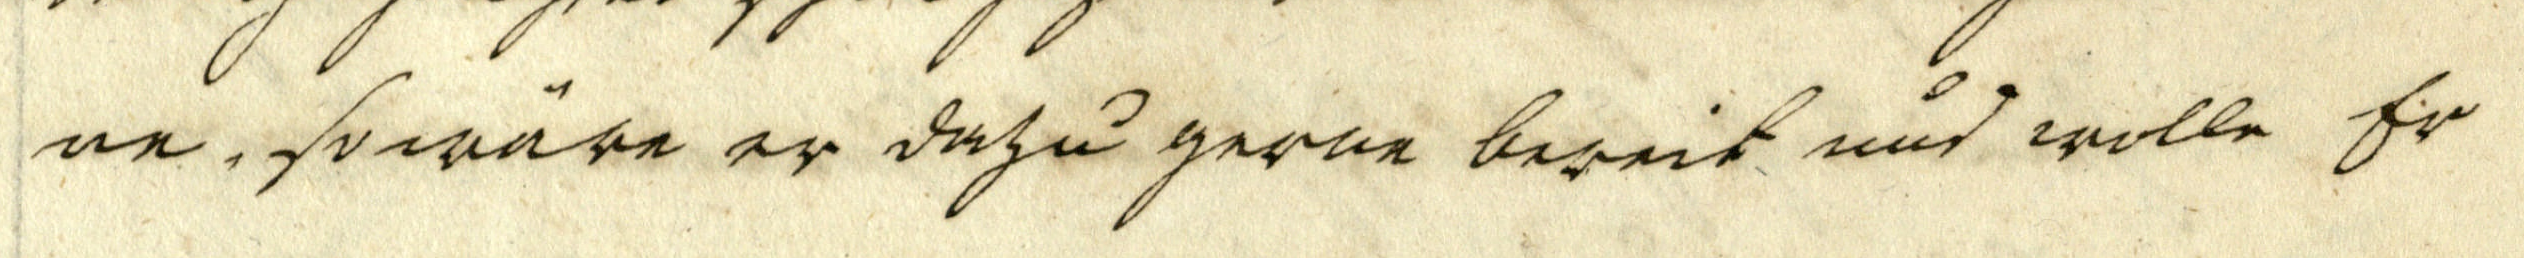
ne, so wäre er dazu gerne bereit und wolle Er
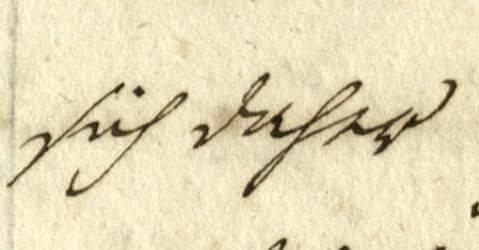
sich daher
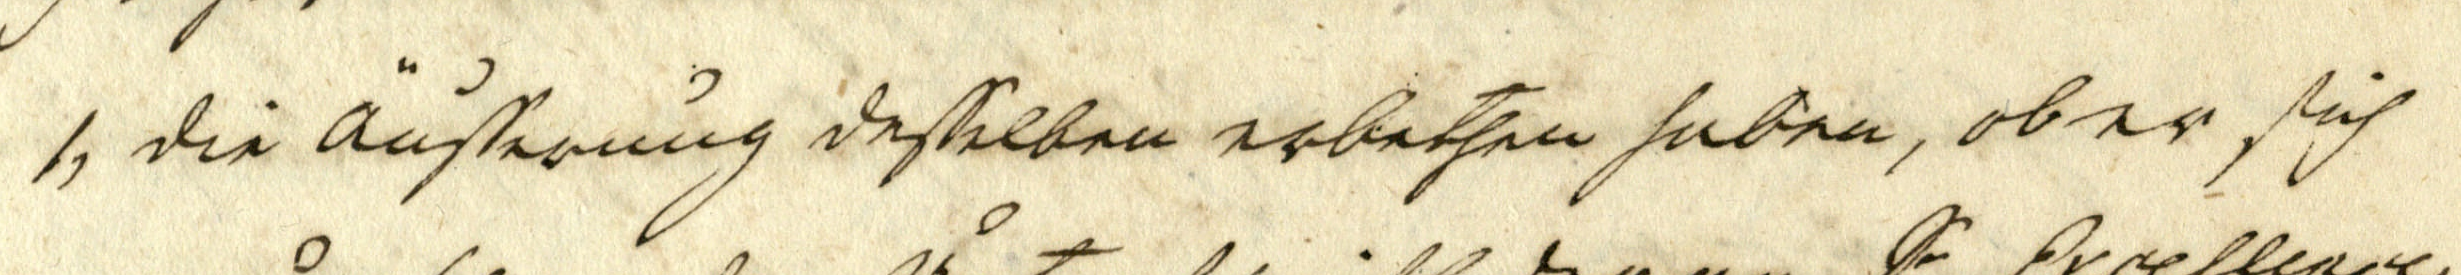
1, die Äusserung desselben erbethen haben, ob er sich
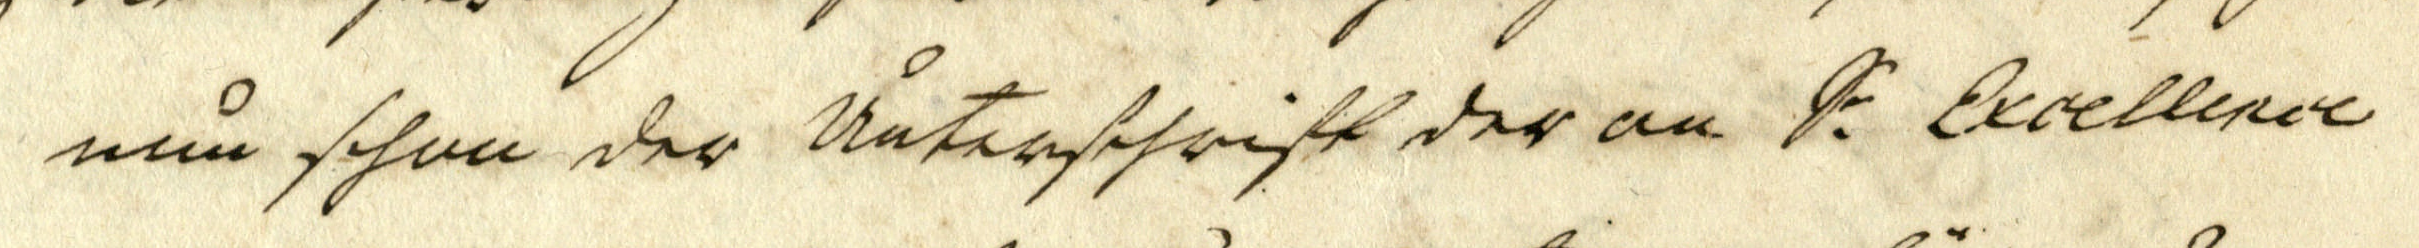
nun schon der Unterschrift der an Sr. Excellence
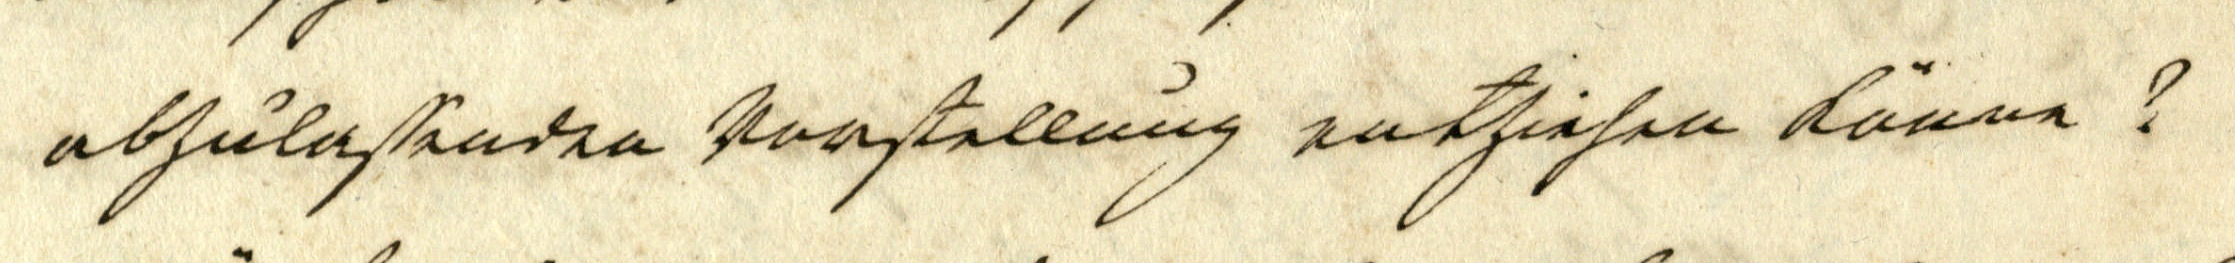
abzulassenden Vorstellung entziehen könne?
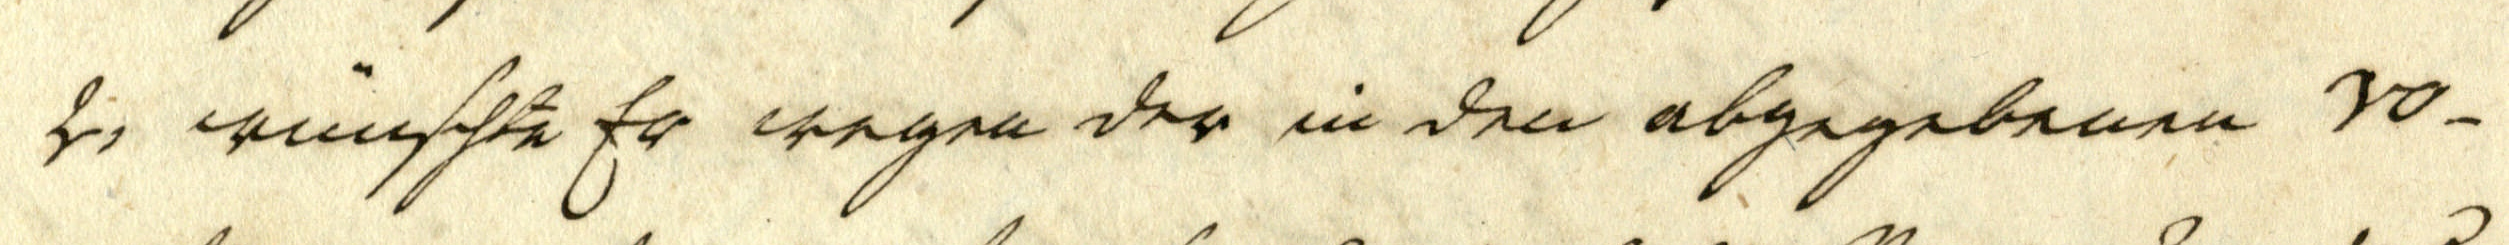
2, wünschte Er wegen der in den abgegebenen vo¬
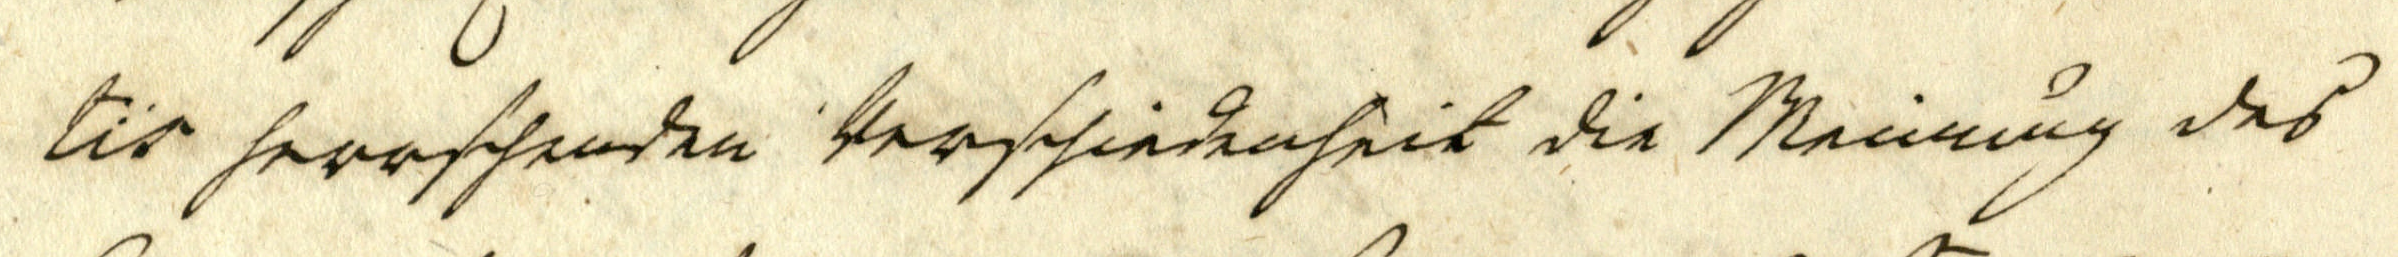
tis herrschenden Verschiedenheit die Meinung des
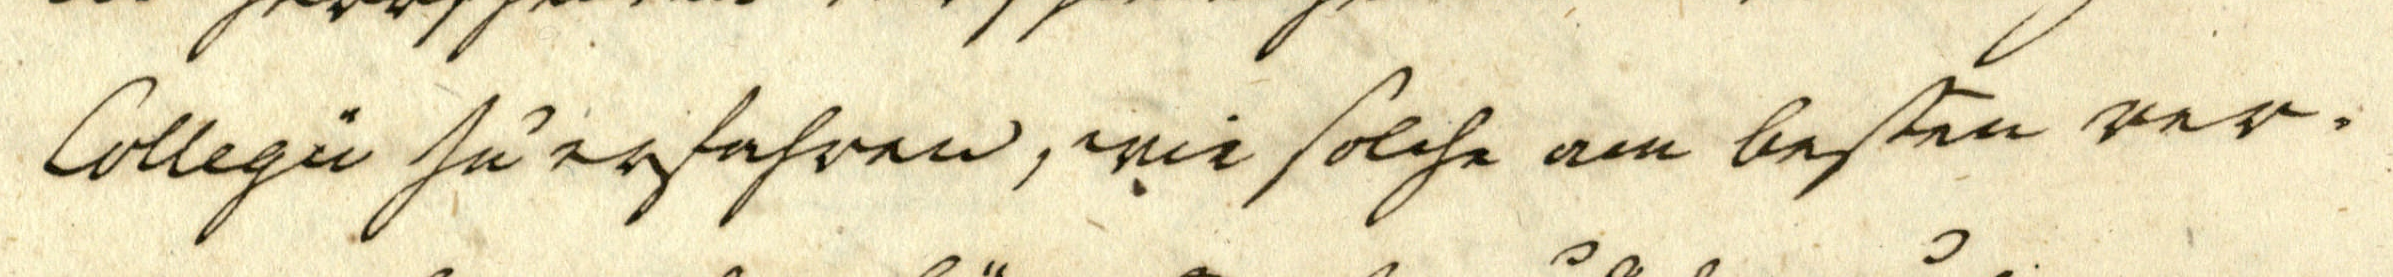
Collegii zu erfahren, wie solche am besten ver¬
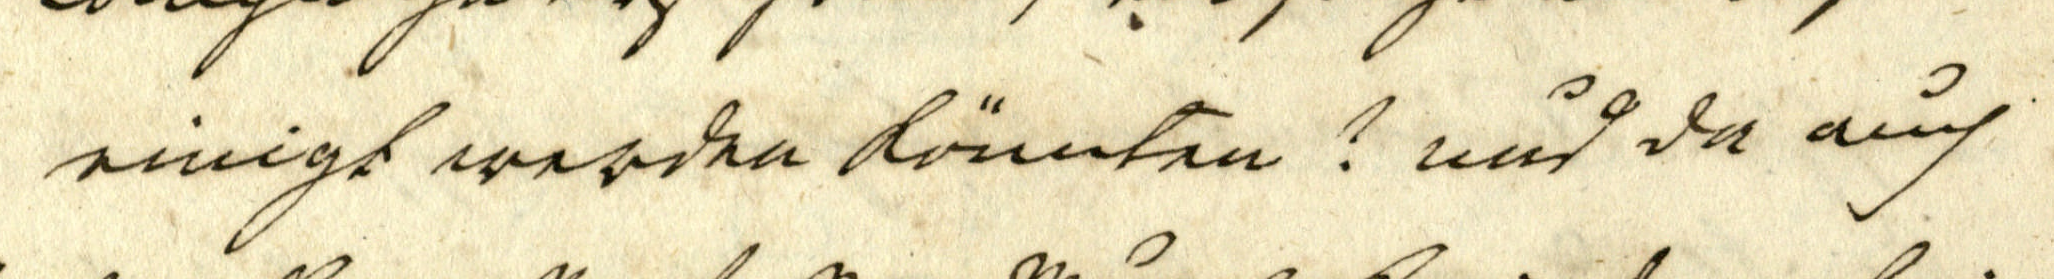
einigt werden könnten? und da auch
